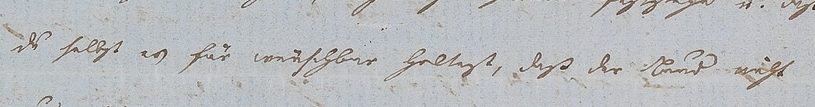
Du selbst es für wünschbar haltest, daß der Bund nicht
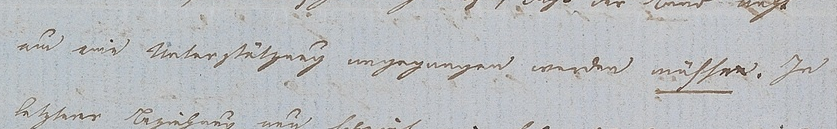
um eine Unterstützung angegangen werden müsse. In
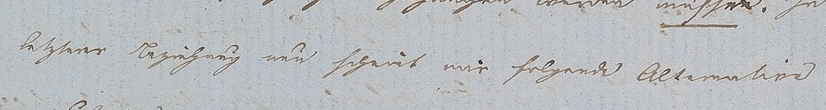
letzterer Beziehung nun scheint mir folgende Alternative
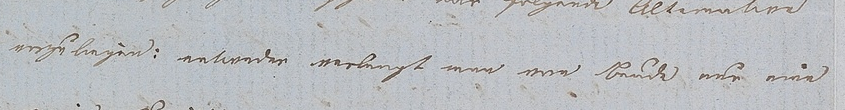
vorzuliegen: entweder verlangt man vom Bunde nur eine
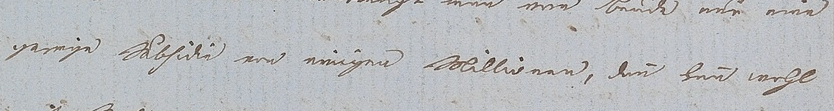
geringe Subsidie von einigen Millionen, dann kann wohl
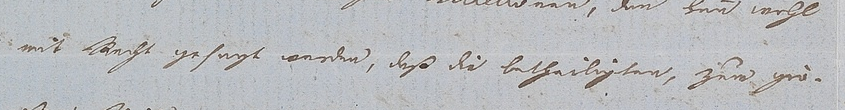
mit Recht gesagt werden, daß die betheiligten, zum grö-
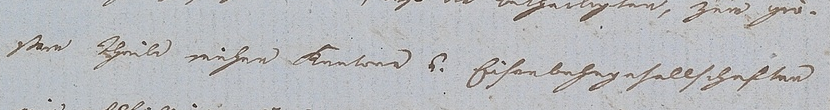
ßern Theile reichen Kantone u. Eisenbahngesellschaften
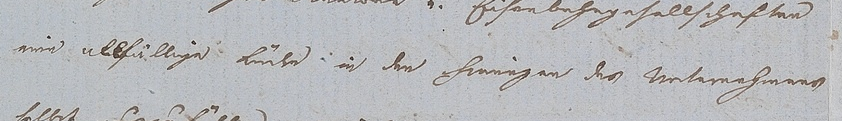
eine allfällige Lücke in den Finanzen des Unternehmens
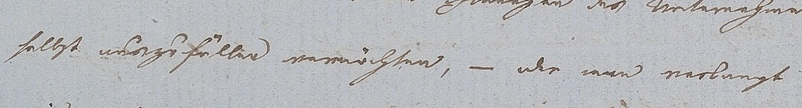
selbst auszufüllen vermöchten, – oder man verlangt
